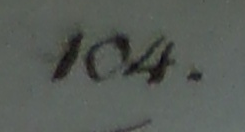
104.
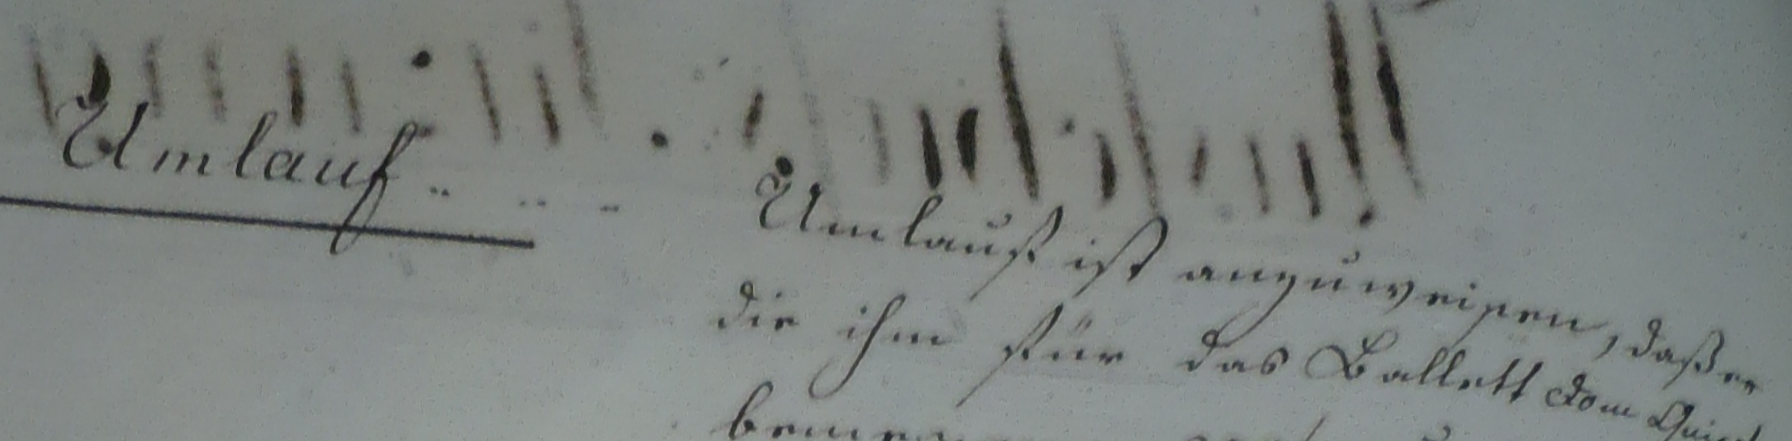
Umlauf .. .. .. Umlauf ist anzuweisen, daß er
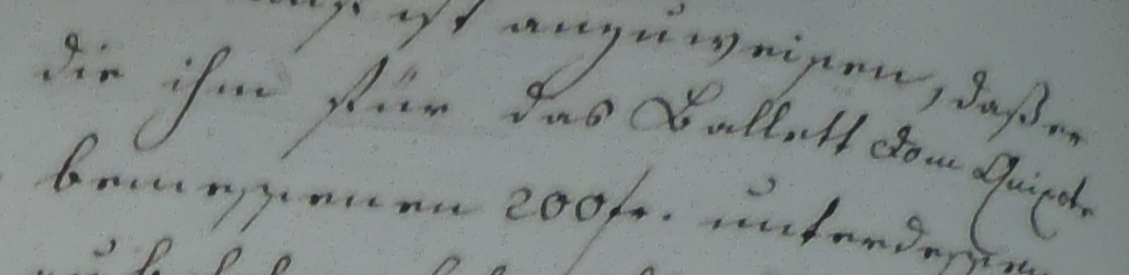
die ihm für das Ballett Don Quixote
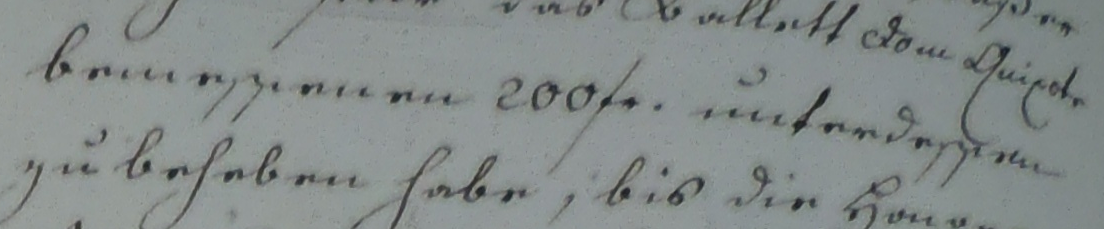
bemessenen 200fr. unterdessen
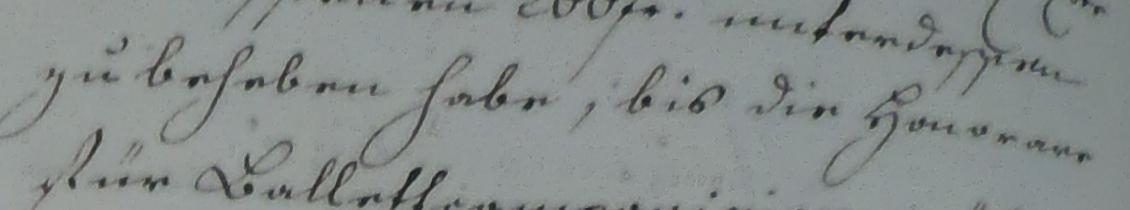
zu beheben habe, bis die Honorare
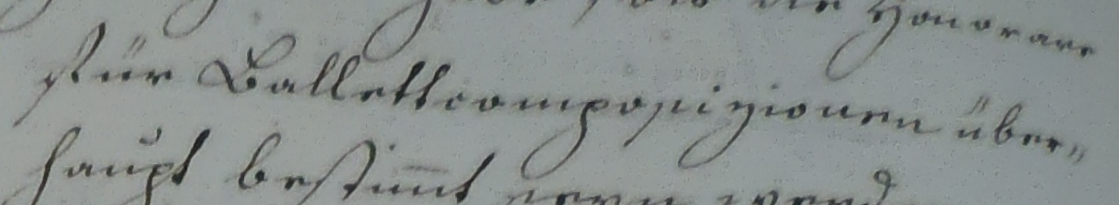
für Ballettcomposizionen über¬
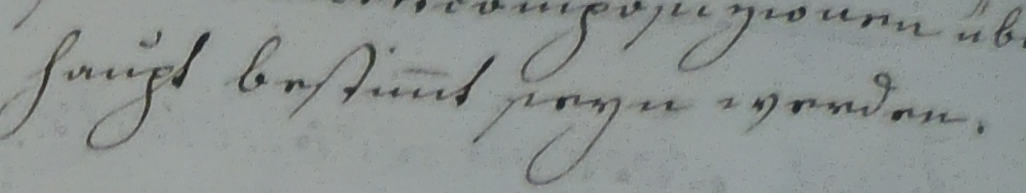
haupt bestim̅t seyn werden.
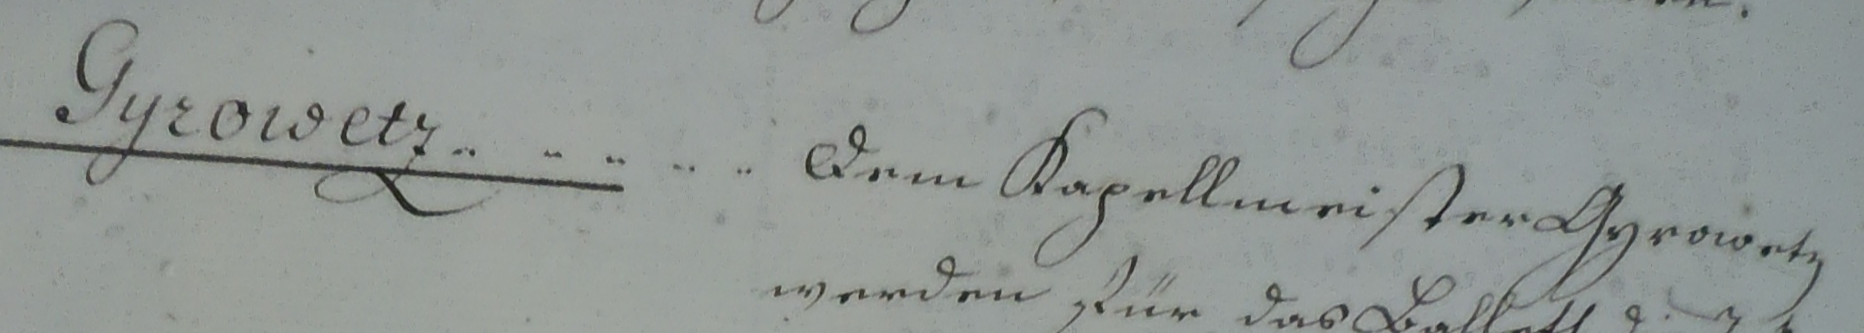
Gyrowetz .. .. .. Dem Kapellmeister Gyrowetz
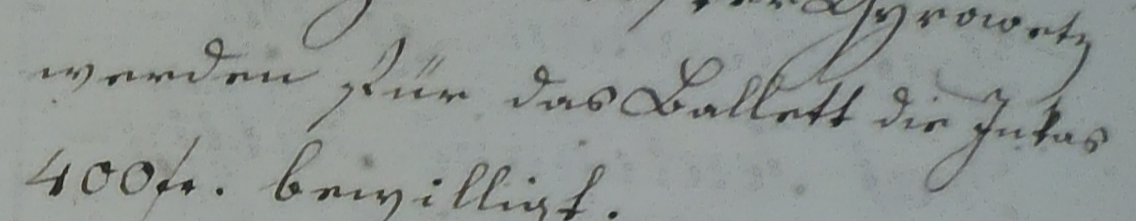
werden für das Ballett die Inkas
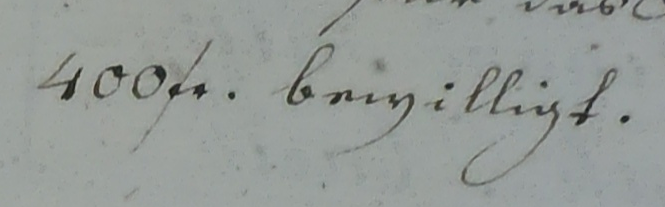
400fr. bewilligt.
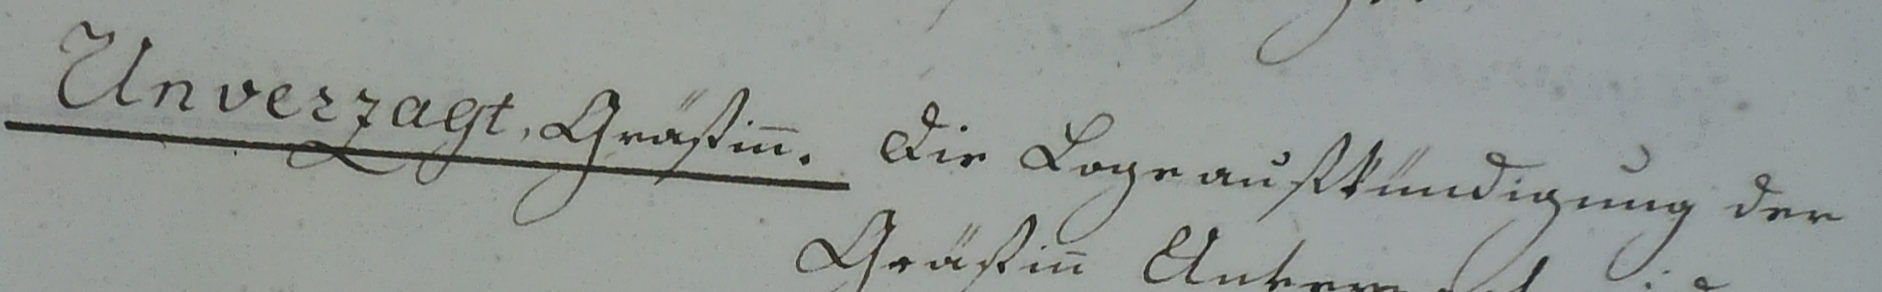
Unverzagt, Grafin̅. Die Logeaufkündigung der
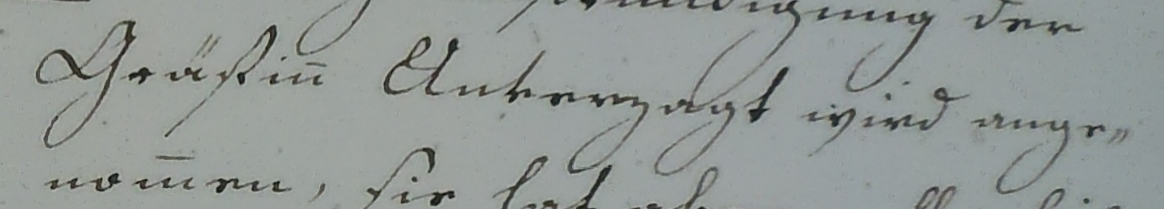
Grafin Unverzagt wird ange¬
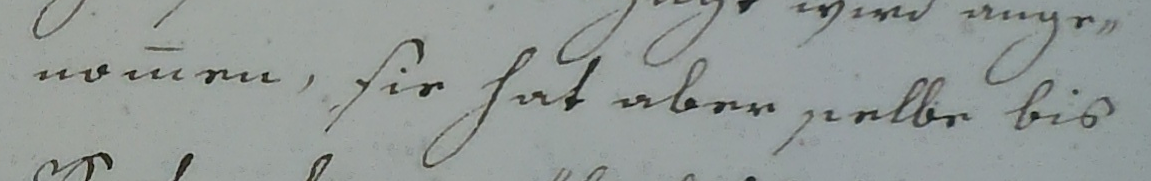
nom̅en, sie hat aber selbe bis
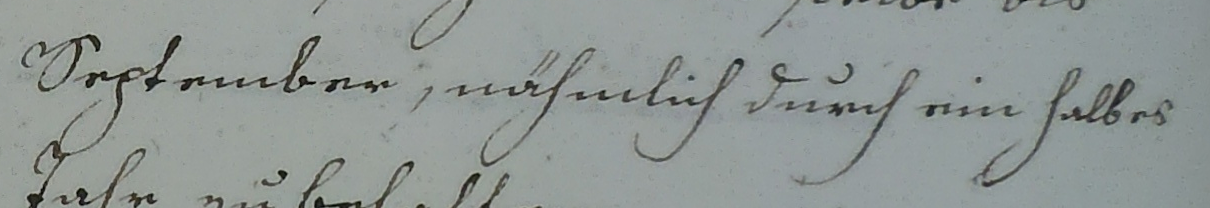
September, nähmlich durch ein halbes
